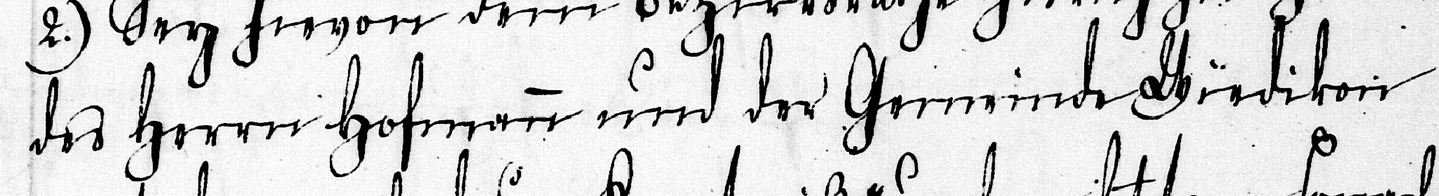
des Herrn Hofmann und der Gemeinde Wiedikon
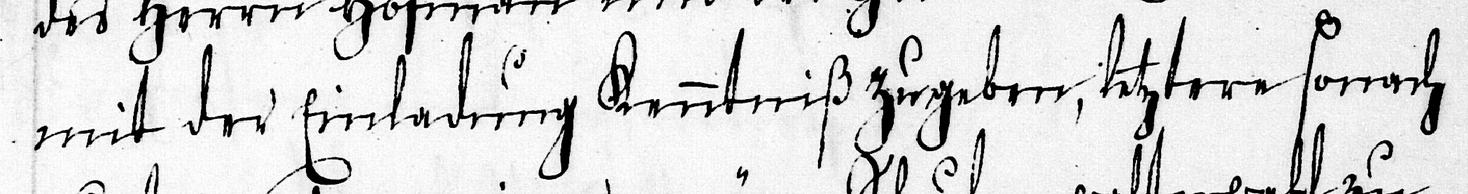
mit der Einladung Kenntniß zu geben, letztere sonach
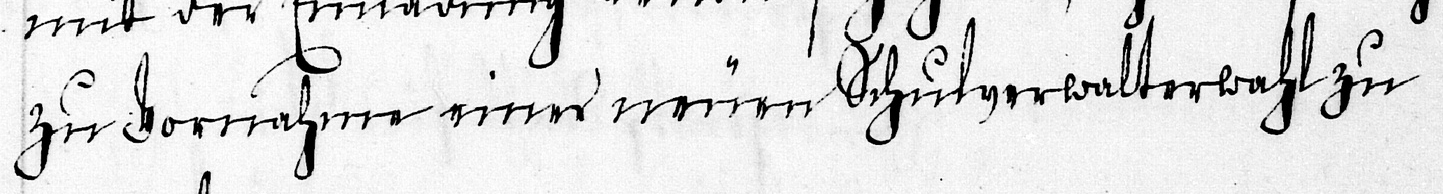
zu Vornahme einer neuen Schulverwalterwahl zu
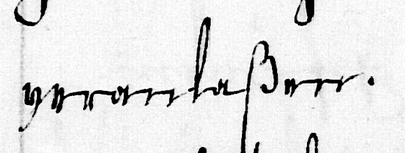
veranlaßen.
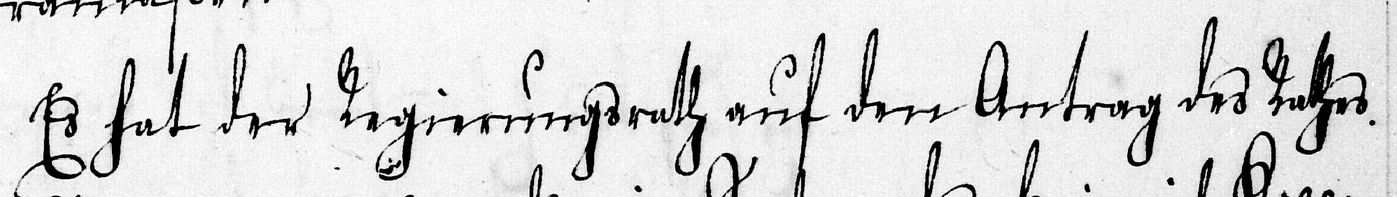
Es hat der Regierungsrath auf den Antrag des Rathes
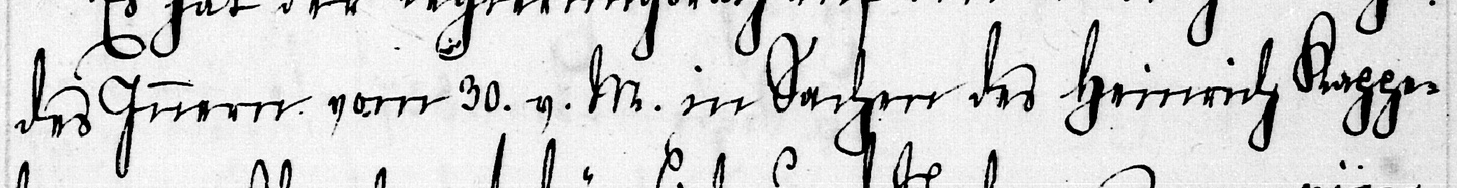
des Innern vom 30. v. M. in Sachen des Heinrich Kappe¬
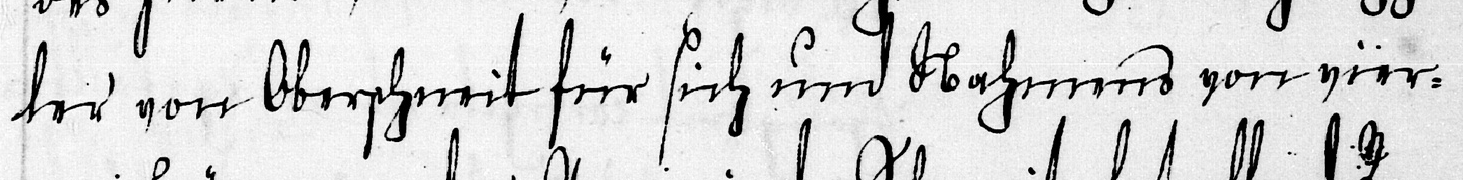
ler von Oberschneit für sich und Nahmens von vier¬
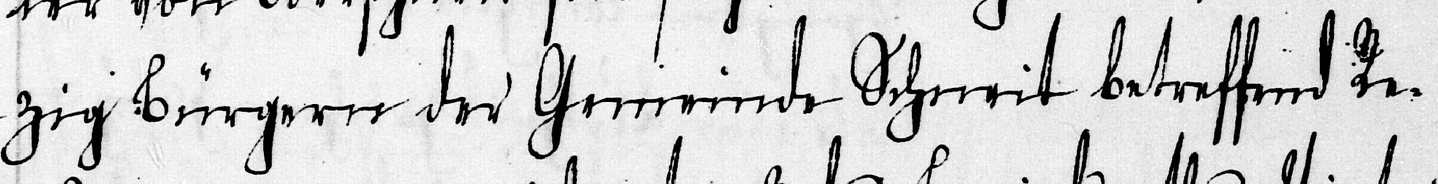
zig Bürgern der Gemeinde Schneit betreffend Re¬
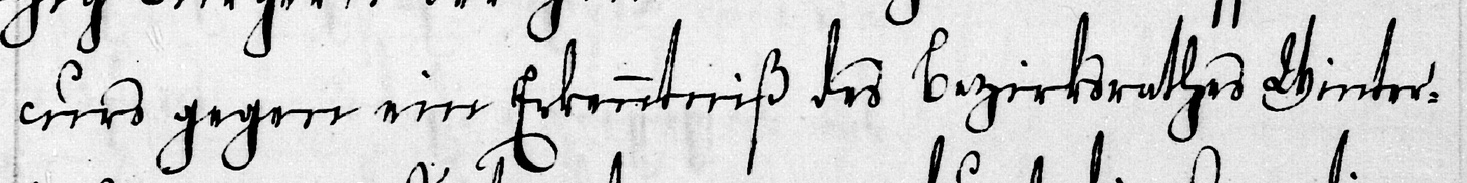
curs gegen ein Erkenntniß des Bezirksrathes Winter¬
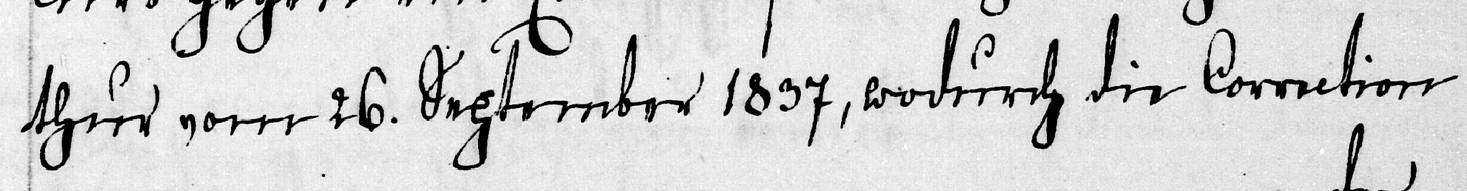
thur vom 26. September 1837, wodurch die Correction
